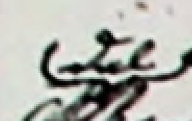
del
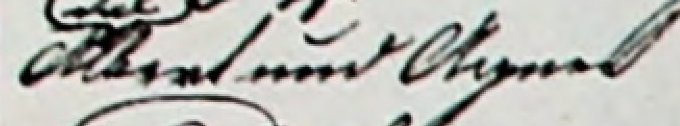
Albert und Agnes
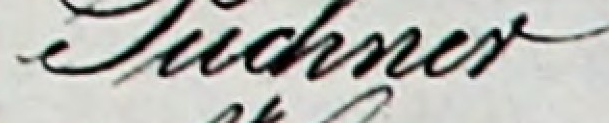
Puchner
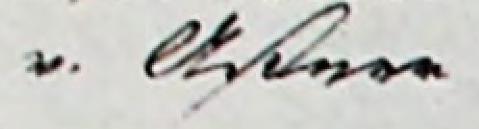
v. Aßner
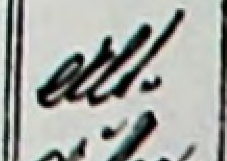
Alt„
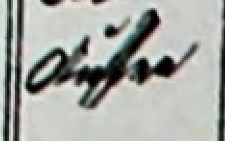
Aussee
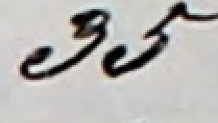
35
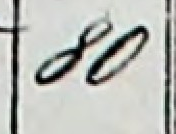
80
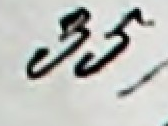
35
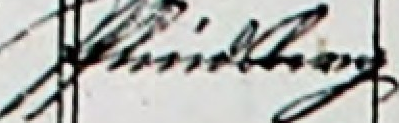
Pflindsberg
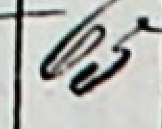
65
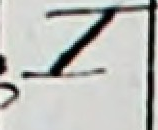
I
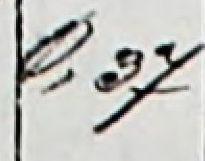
0,37
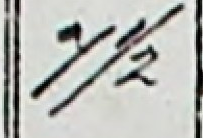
7 ½
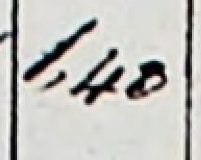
1,48
